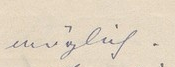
möglich.
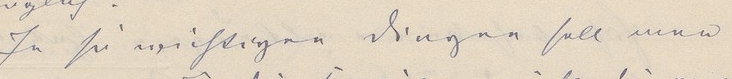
In so wichtigen Dingen soll man
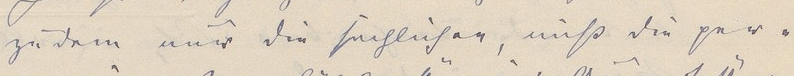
zudem nur die sachlichen, nicht die per-
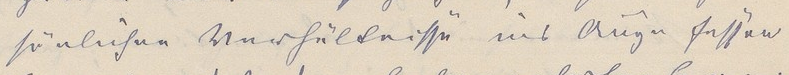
sönlichen Verhältnisse ins Auge fassen.
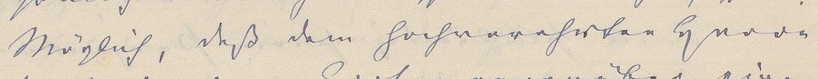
Möglich, daß dem hochverehrten Herrn
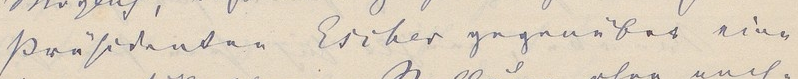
Präsidenten Escher gegenüber eine
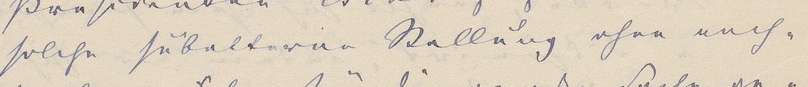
solche subalterne Stellung ohne nach-
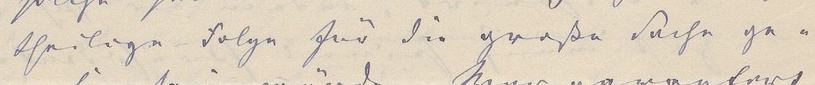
theilige Folge für die große Sache ge-
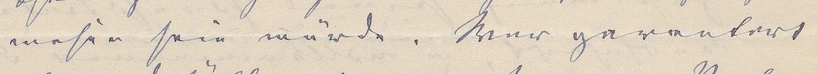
nehm sein würde. Wer garantirt
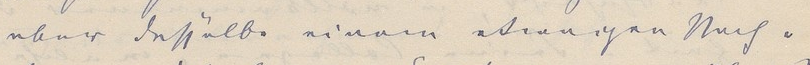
aber dasselbe einem etwaigen Nach-
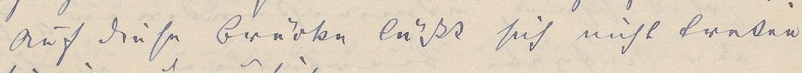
Auf diese Brücke läßt sich nicht treten,
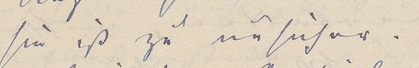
sie ist zu unsicher.
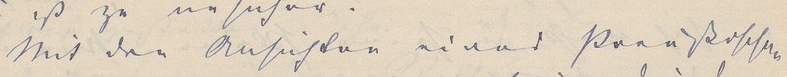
Mit den Ansichten eines Preußischen
